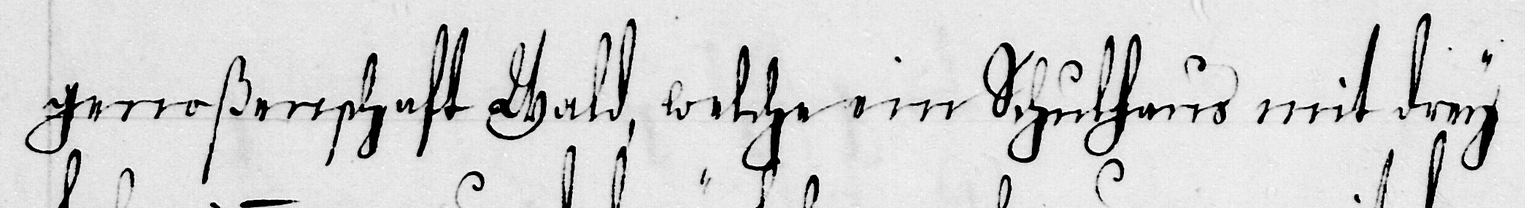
genoßenschaft Wald, welche ein Schulhaus mit drey
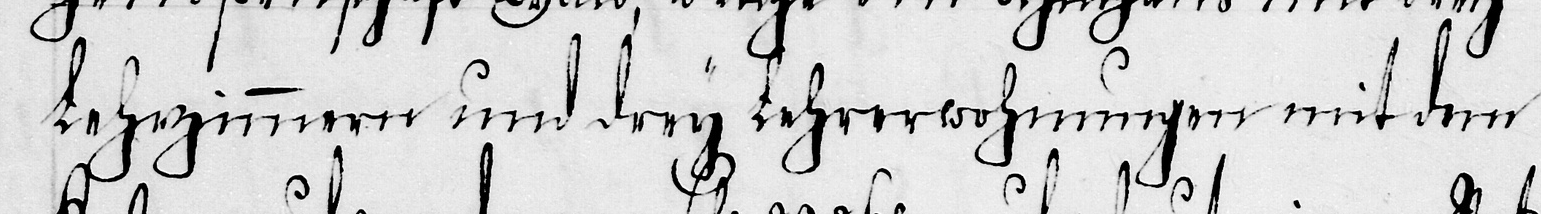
Lehrzimmern und drey Lehrerwohnungen mit dem
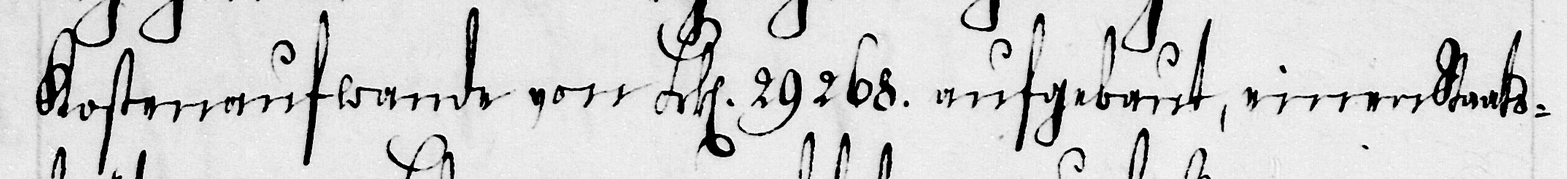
Kostenaufwande von Frk[en]. 29 268. aufgebaut, einen Staats¬
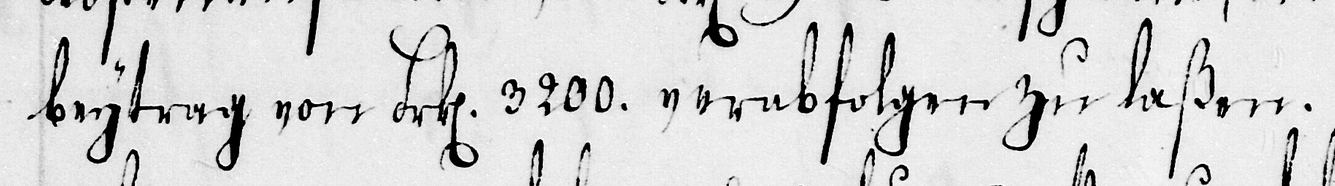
beytrag von Frk[en]. 3200. verabfolgen zu laßen.
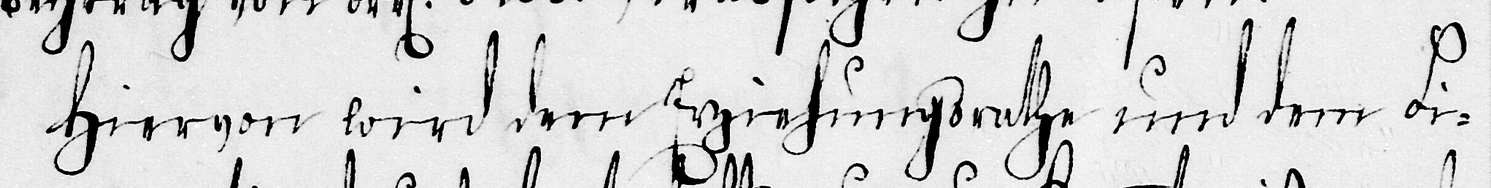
Hiervon wird dem Erziehungsrathe und dem Fi¬
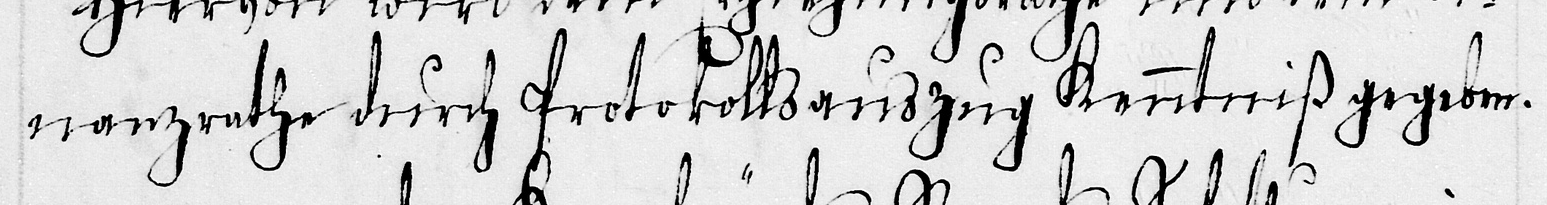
nanzrathe durch Protokollsauszug Kenntniß gegeben.
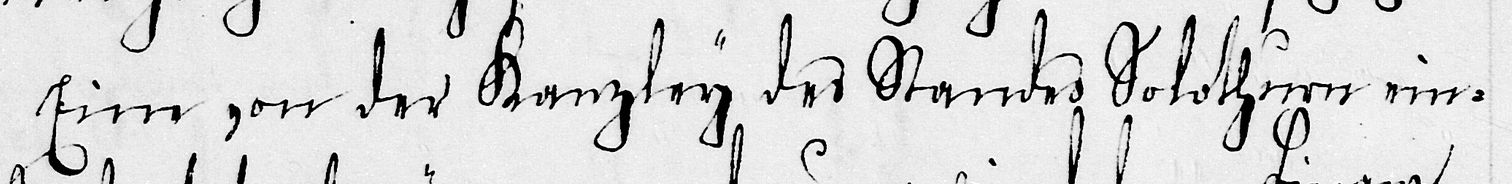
Eine von der Kanzley des Standes Solothurn ein¬
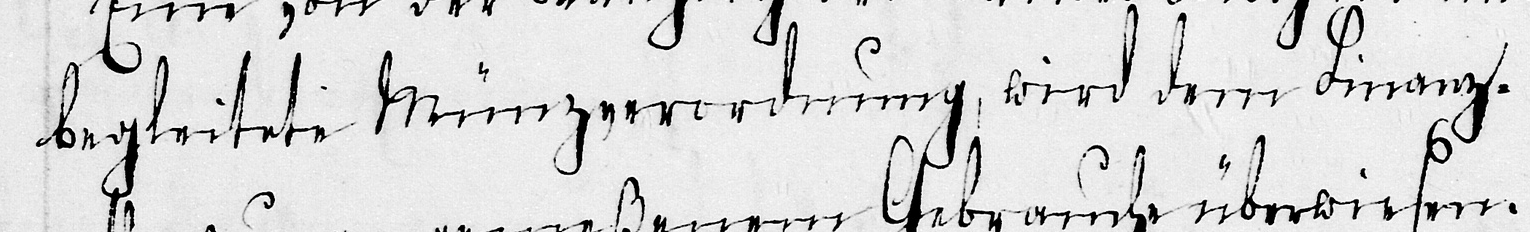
begleitete Münzverordnung, wird dem Finanz¬
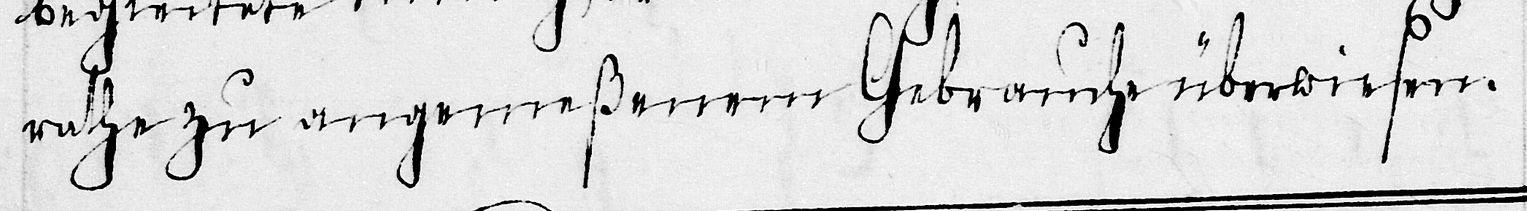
rathe zu angemeßenem Gebrauche überwiesen.
